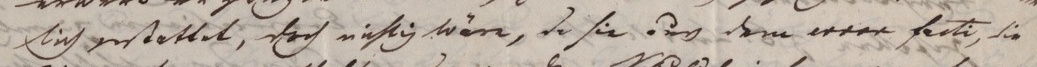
lich gestattet, doch nichtig wäre, da sie aus dem error facti, die
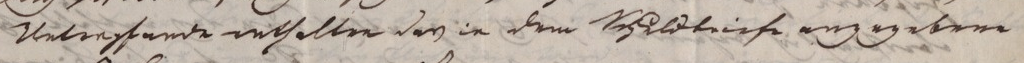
Unterpfande enthalten das in dem Schuldbrief angegebene
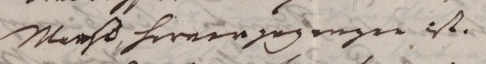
Maaß, hervorgegangen ist.
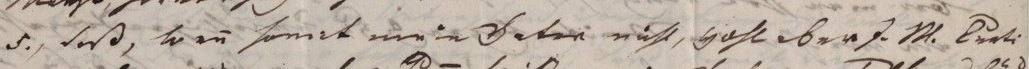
5.) Daß, wenn somit mein Vater nicht, wohl aber J. M. Curti
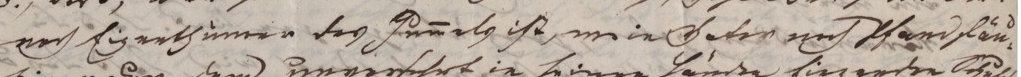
noch Eigenthümer des Hummels ist, mein Vater noch Pfandgläu-
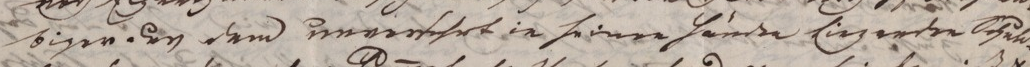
biger aus dem unversehrt in seinen Händen liegenden Schuld-
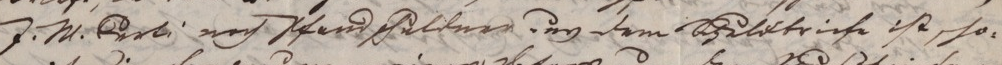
J. M. Curti noch Pfandschuldner aus dem Schuldbriefe ist, so-
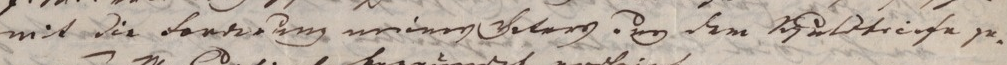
mit die Forderung meines Vaters aus dem Schludbriefe ge-
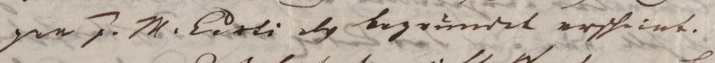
gen J. M. Curti als begründet erscheint.
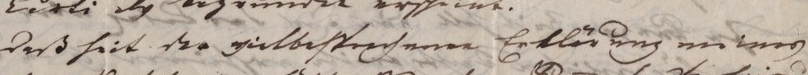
Daß seit der vielbesprochenen Erklärung meines
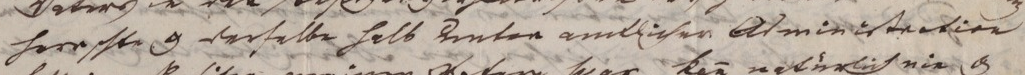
herrschte & derselbe halb unter amtlicher Administration
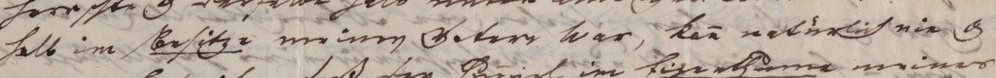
halb im Besitze meines Vaters war, kann natürlich nie &
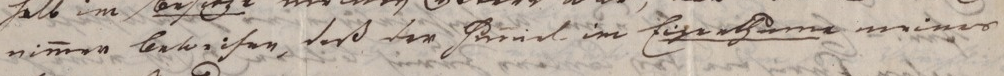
nimmer beweisen, daß der Hummel im Eigenthumemeines
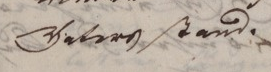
Vaters stand.
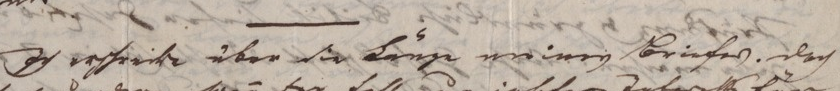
Ich erschrecke über die Länge meines Briefes. Doch
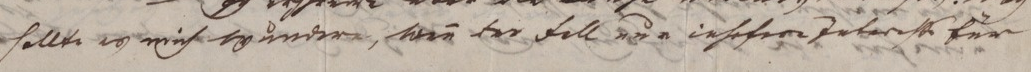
sollte es mich wundern, wenn der Fall nur insofern Interesse für
